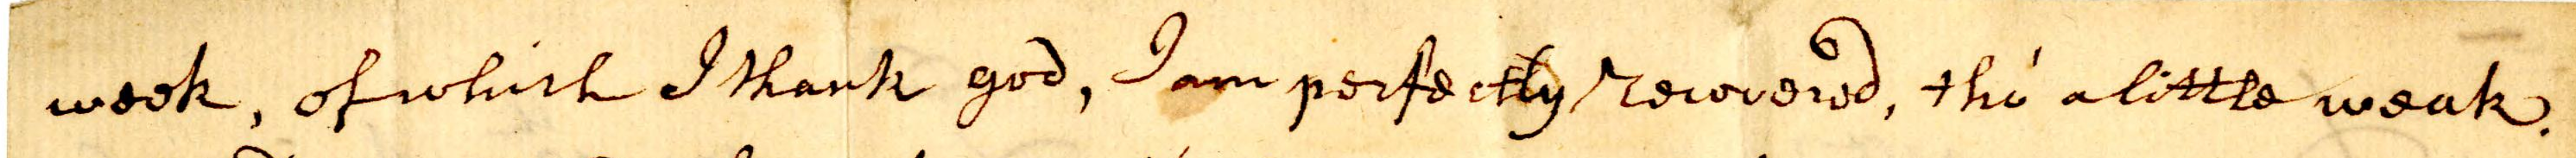week, of which I thank god, I am perfectly recovered, tho' a little weak.
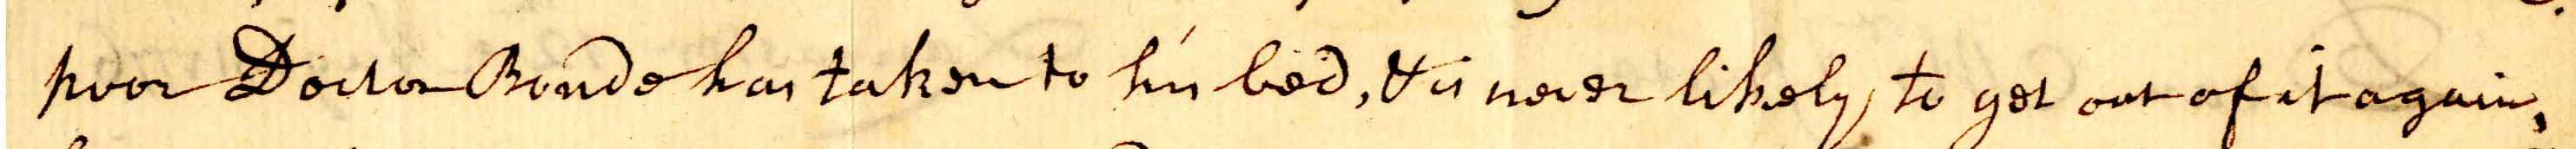poor Doctor Brande has taken to his bed, & is never likely to get out of it again.
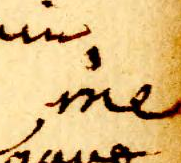in
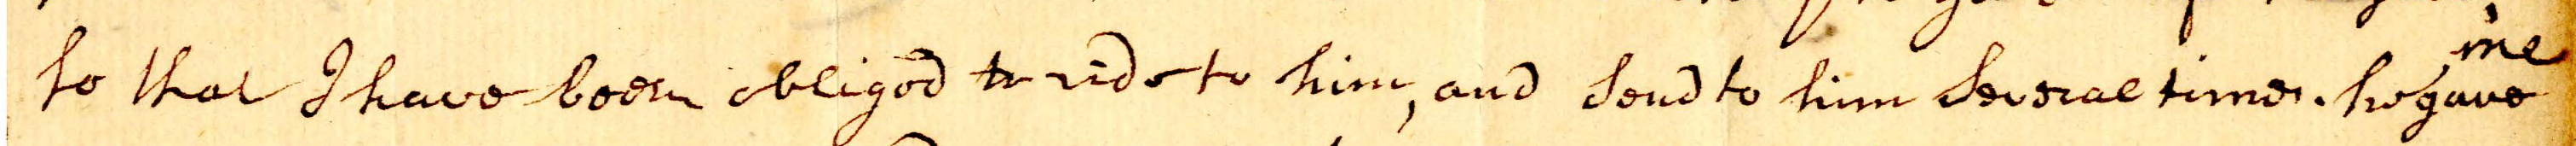so that I have been obliged to ride to him, and send to him Several times. he gave
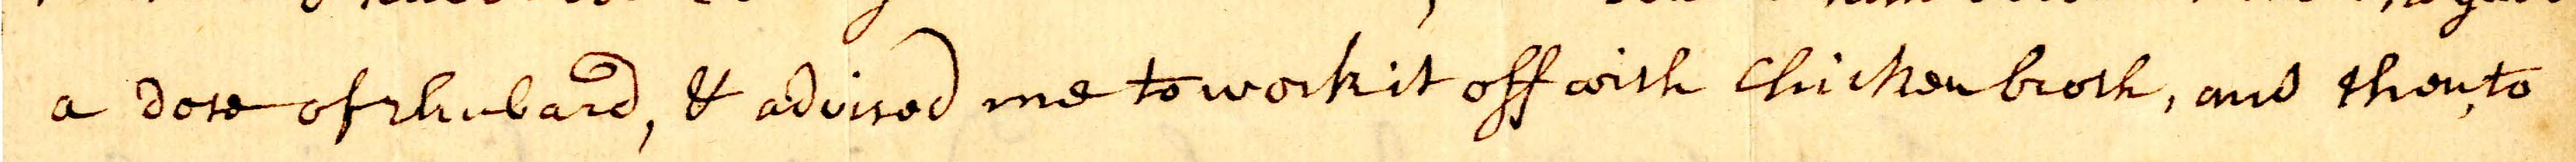a dose of rhubard, & advised me to work it off with Chicken broth, and then to
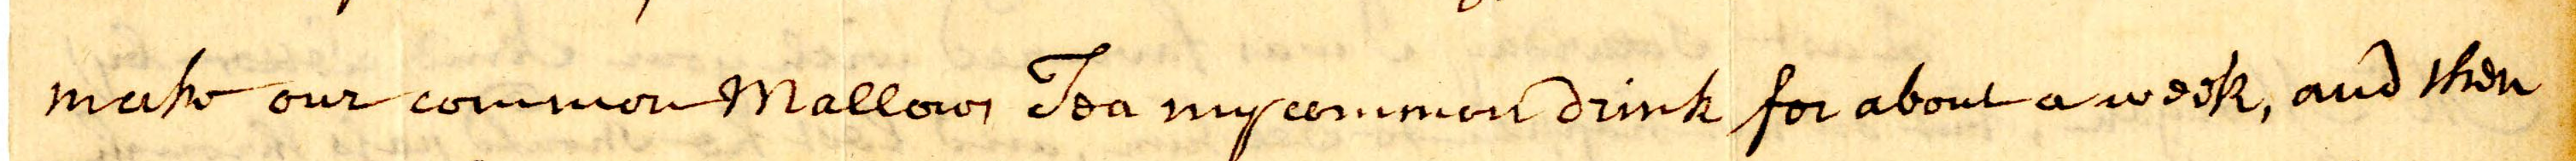make our common Mallows Tea my common drink for about a week, and then
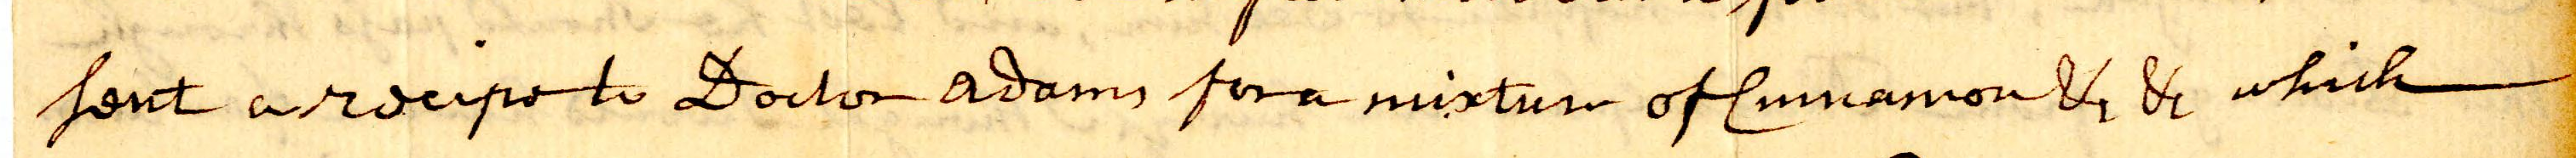sent a recipe to Doctor Adams for a mixtur of Cinamon &c &c which
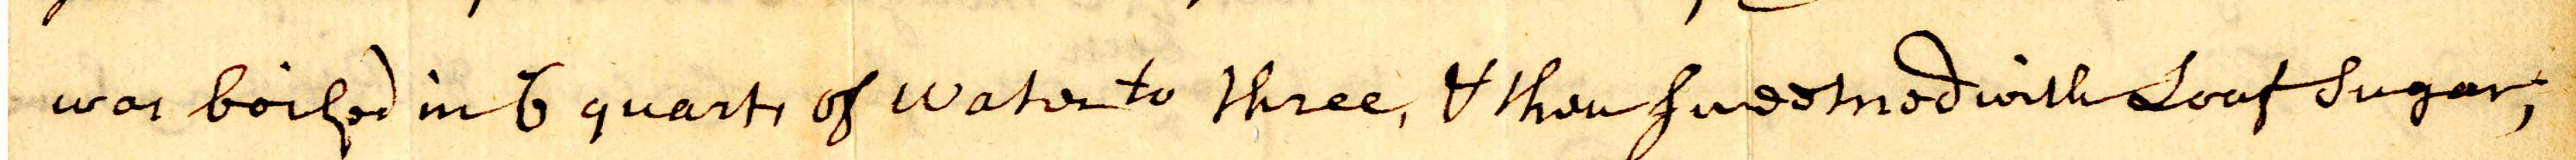was boiled in 6 quarts of Water to three, & then sweetened with Loaf Sugar,
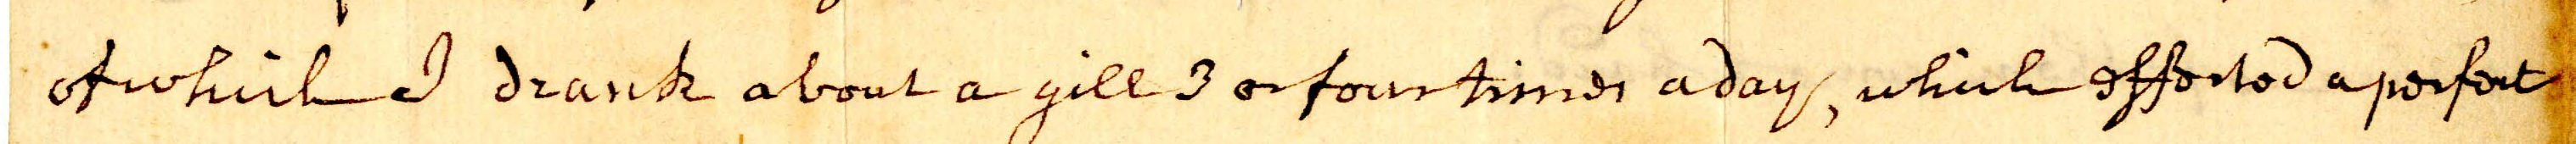of which I drank about a gill 3 or four times a day, which afforded a perfect
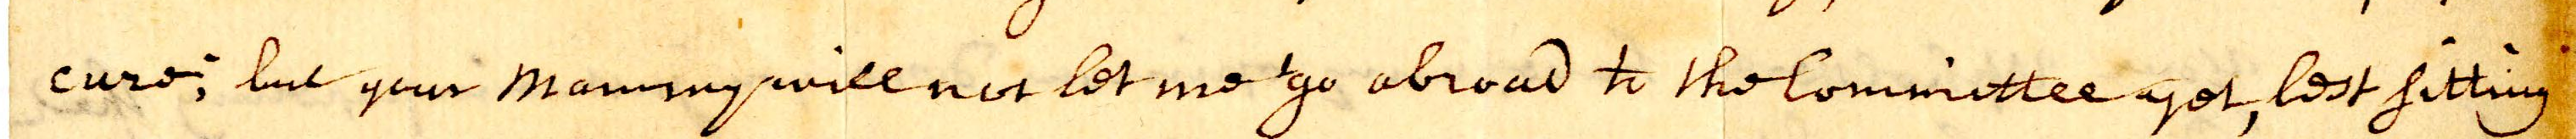cure; but your Mammy will not let me go abroad to the Committee yet, lest sitting
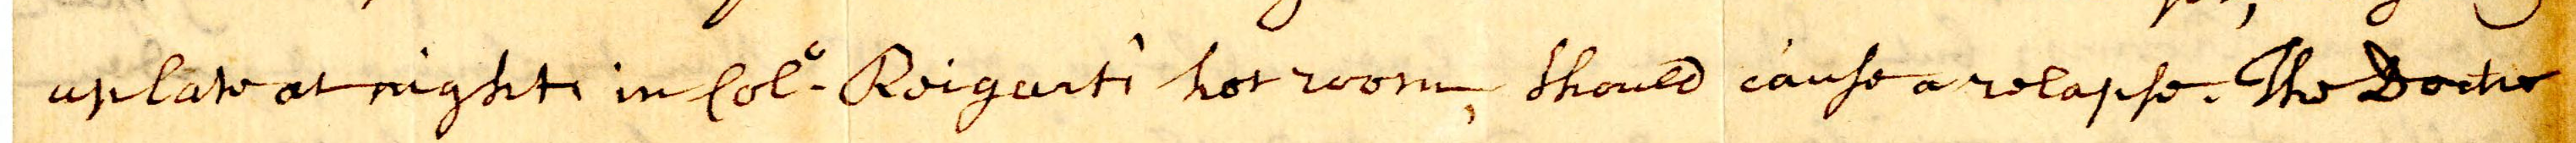up late ate night in Col^o. Roigart's hot room, should cause a relapse. The Doctor
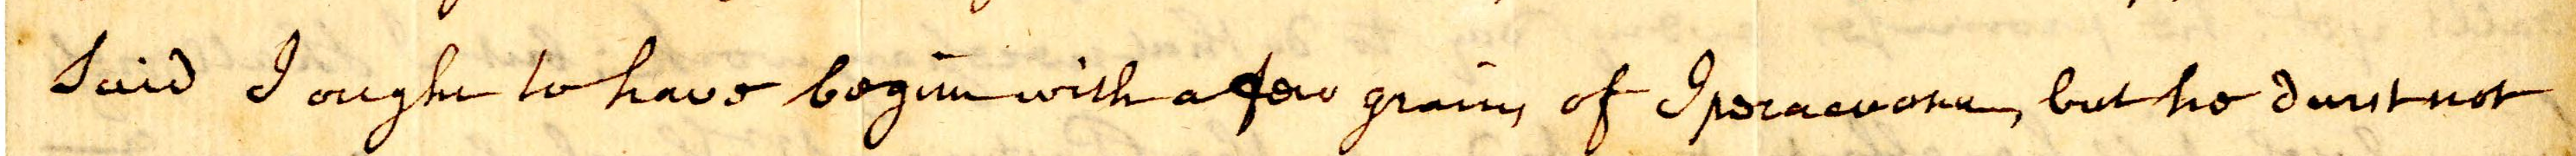said I ought to have begun with a few grains of Iperacuons, but he durst not
